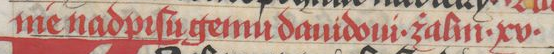nie u gemu davidovi.żalm.xv.
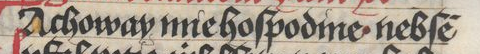Achoway mie hoſpodine.neb ſē
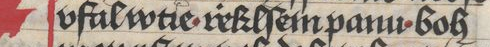ufal w tie.ṙeklſem panu.boh
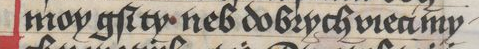moy gſi ty.nebo dobrych viecí my¬
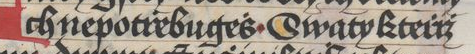ch nepotṙebugeṡ.Swaty kteṙiż
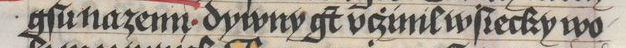gſu na zemi.dywny ḡt ucżinil wẛiecky wo¬
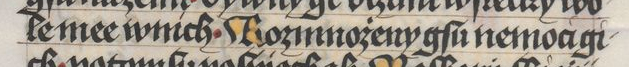le mee wnich.Rozmnożeny gſu nemoci gi¬
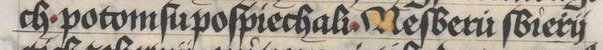ch.potom ſu poſpiechali.Neſberu ſbieṙij
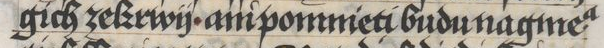gich zekrwij.ani pomnieti budu na gmea
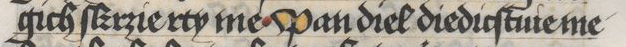gich ſkrzie rty me.Pan diel diedicſtvie me¬
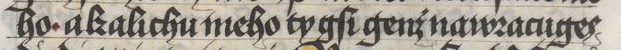ho.a kalichu meho ty gſi genż nawracuges
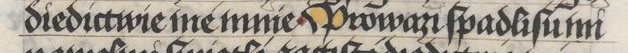diedictwie iné mnie.Prowazi ſpadliſu mi
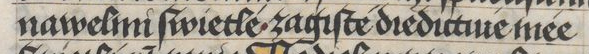na welmi ſwietlé.zagiſté diedictvie mée
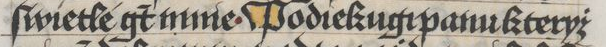ſwietlé ḡt mnie.Podiekugi panu kteryż
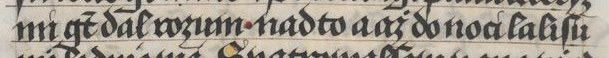mi ḡt dal rozum.nad to a aż do noci lali ſu
